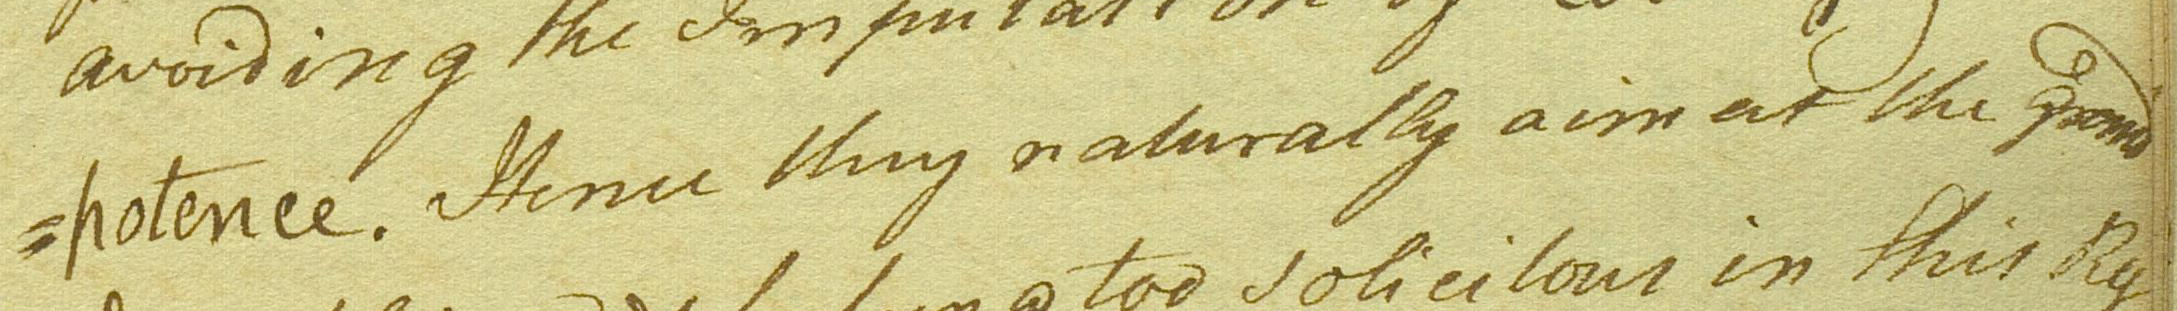-potence. Hence very naturally aim at the grand
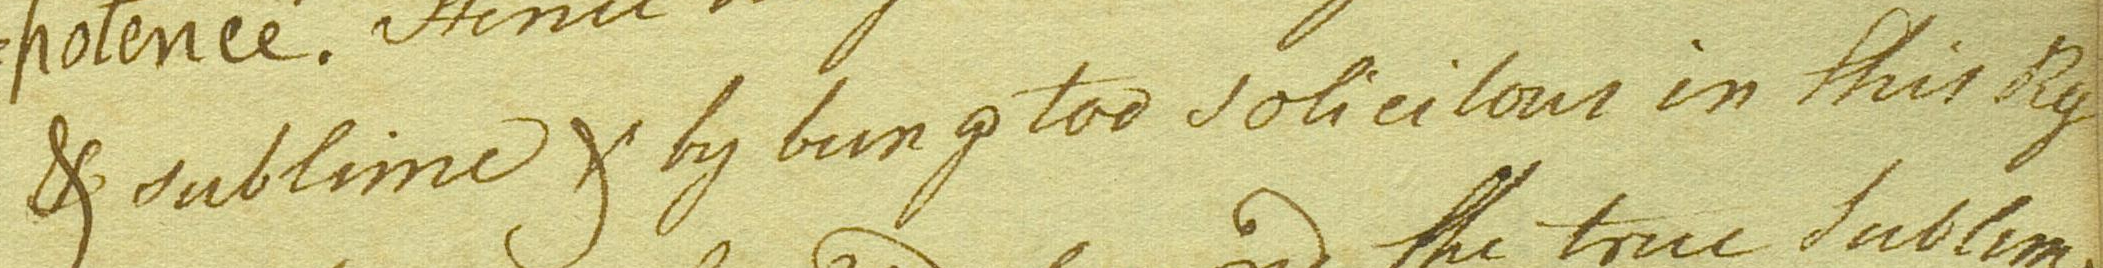& sublime & by being too solicitous in this Res
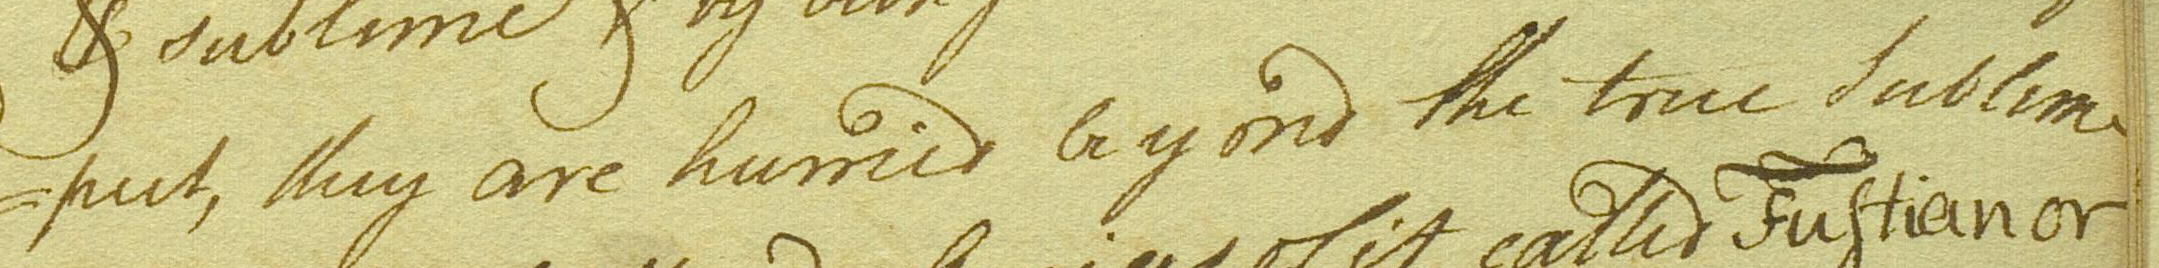-pect, they are hurried beyond the true Sublime
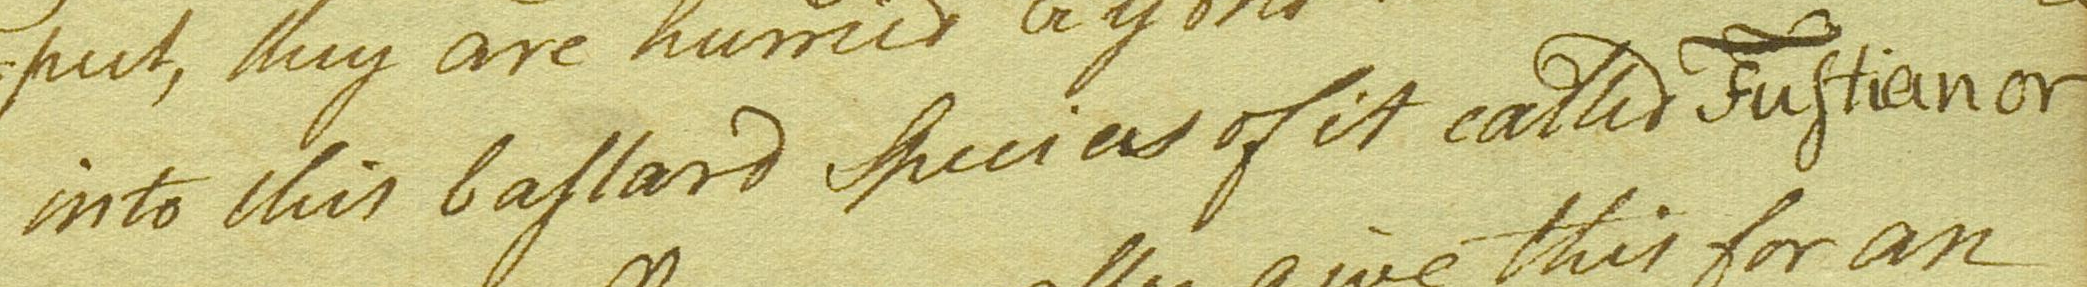into this bastard Species of it called Fustian or
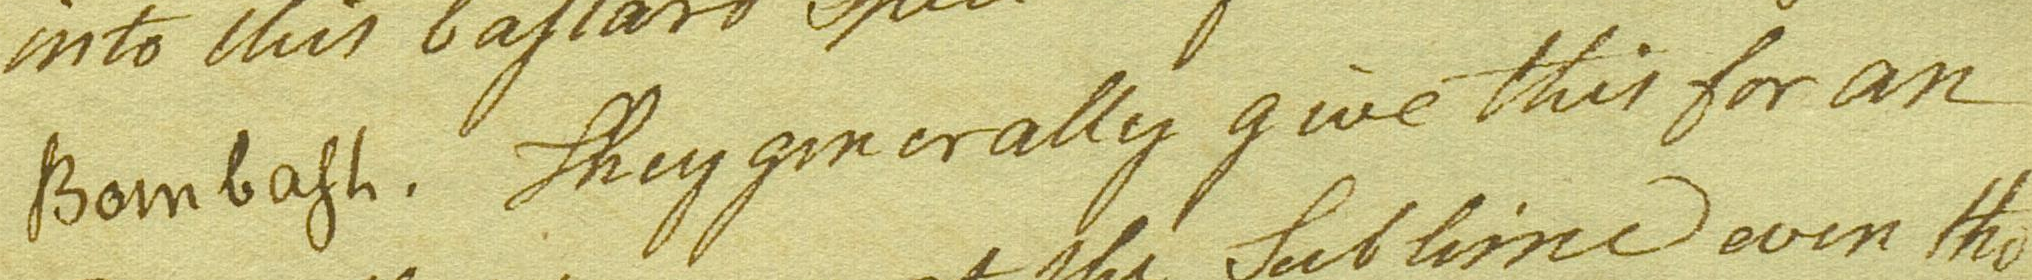Bombast. They generally give this for an
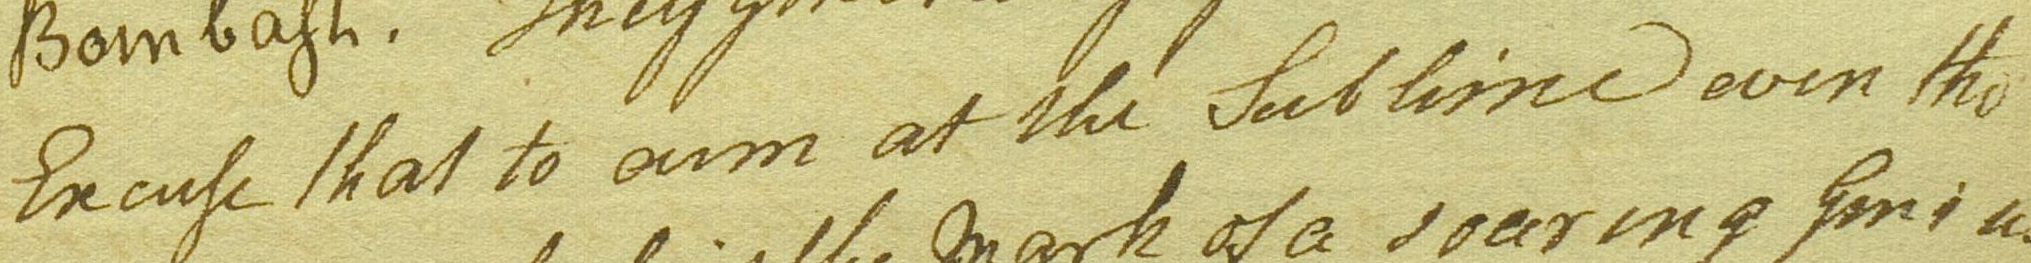Excuse that to aim at the Sublime even tho
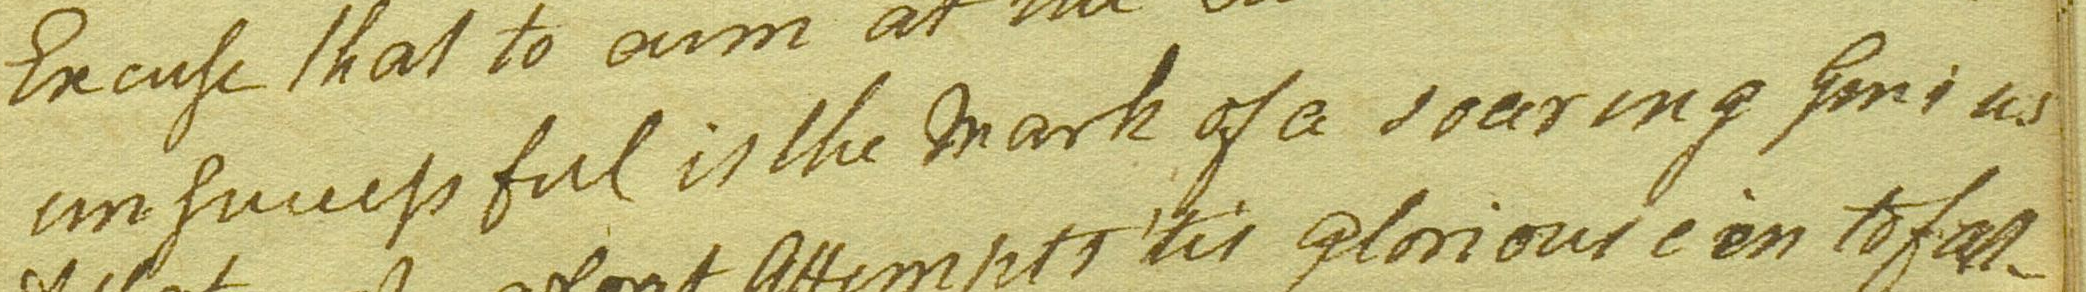unsuccessful is the Mark of a soaring Genius
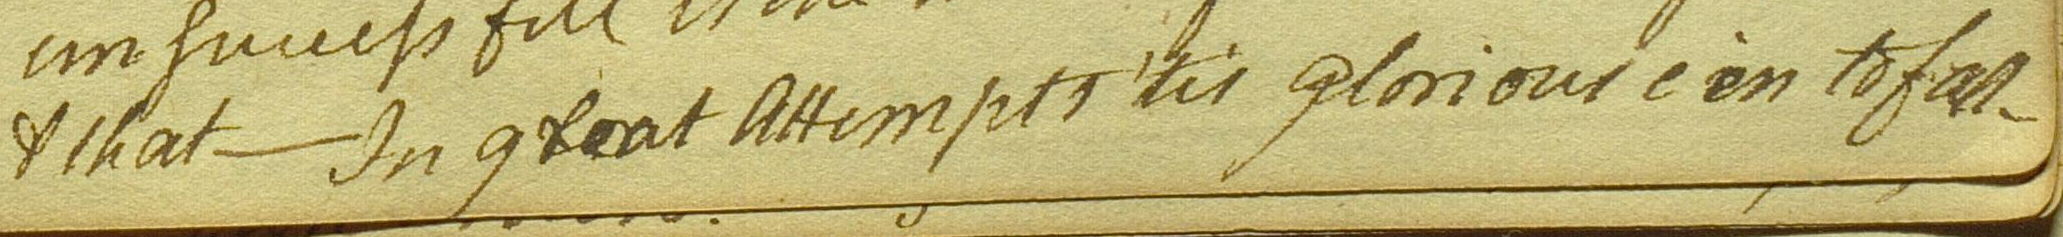& that– In great Attempts 'tis glorious i[_]n to far-
